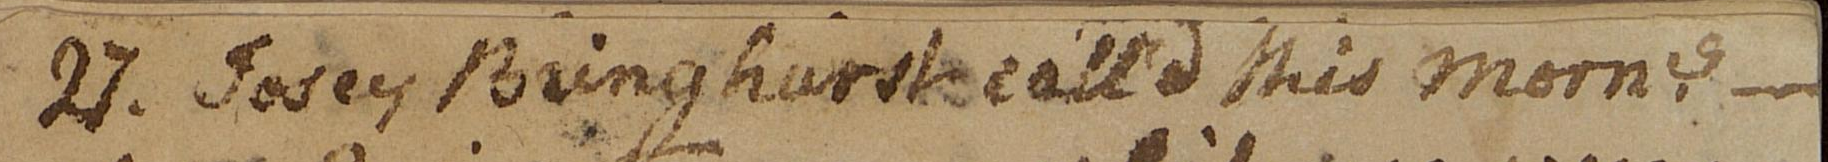27. Josey Bringhurst call'd this morn^g.-
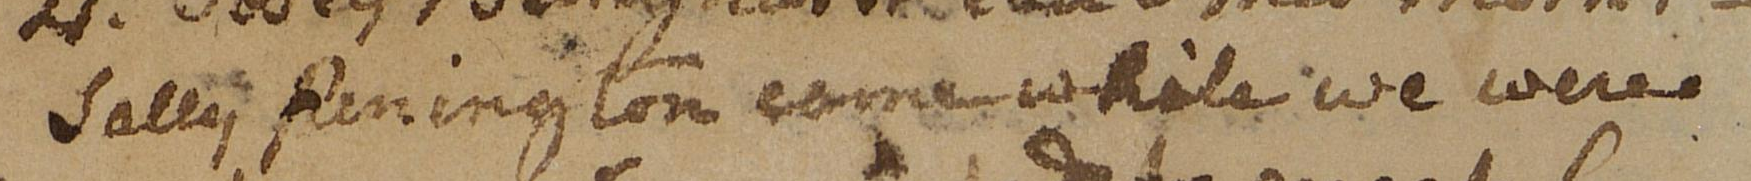Sally Penington came while we were
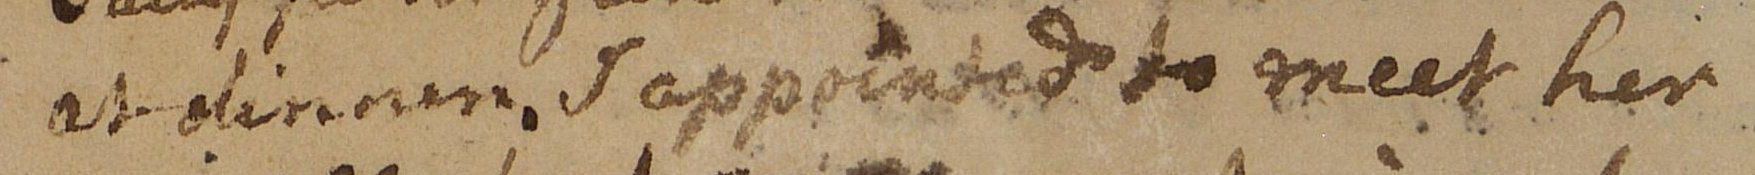at dinner, I appointed to meet her
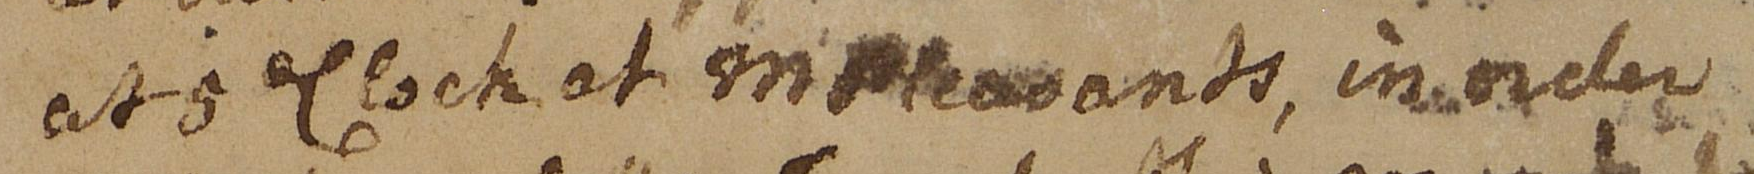at 5 ^o Clock at M Pleasants, in order
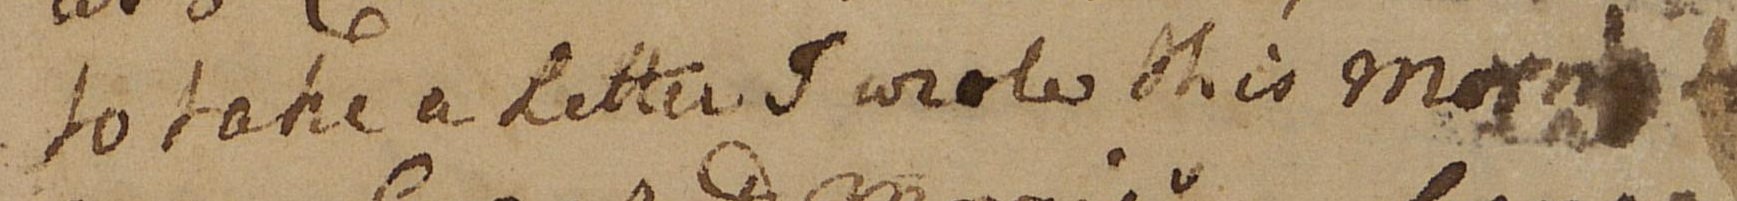to take a Letter I wrote this morng to
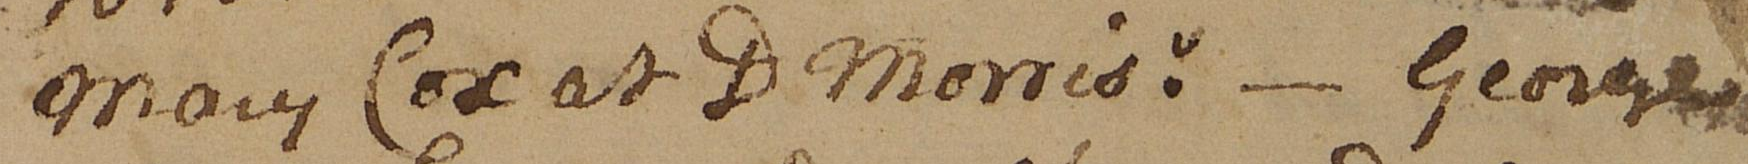Mary Cox at D Morris^s.- George
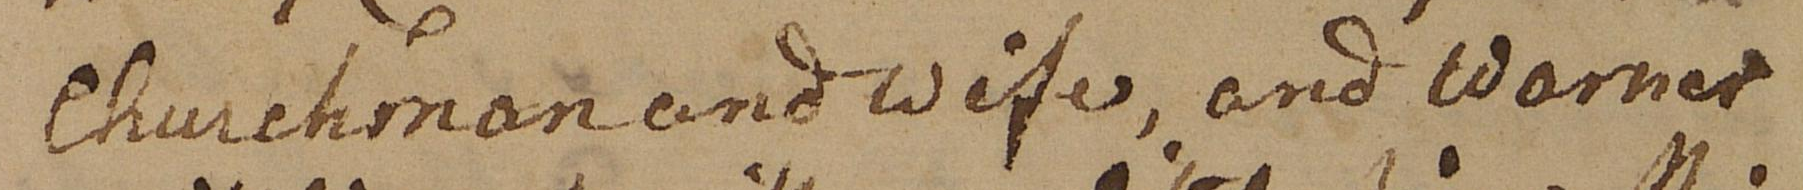Churchman and wife, and Warner
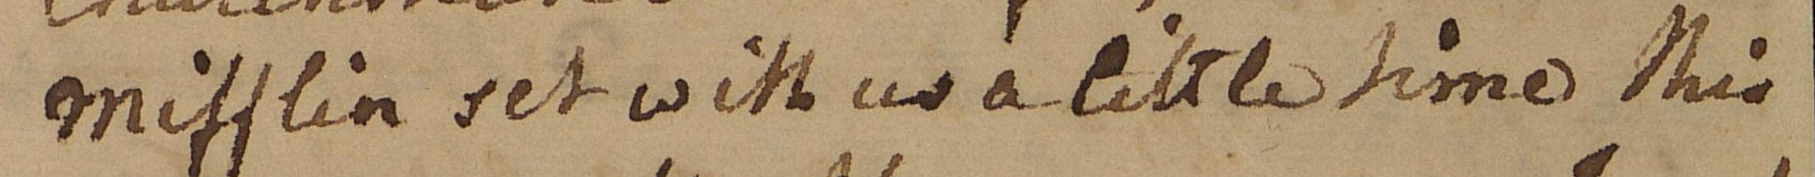Mifflin set with us a little time this
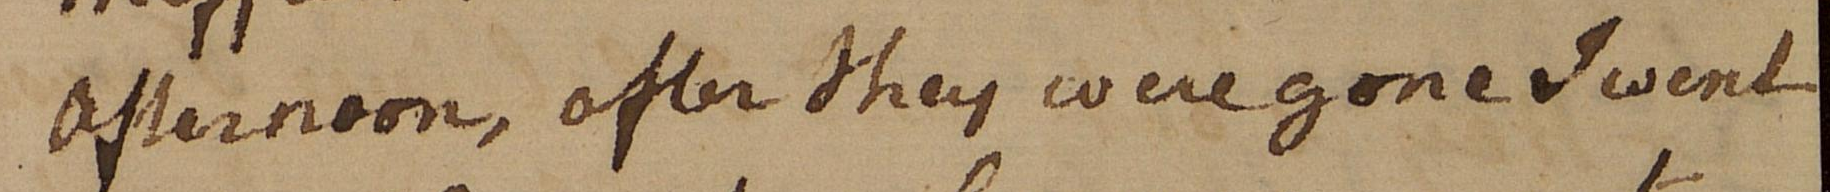afternoon, after they were gone I went
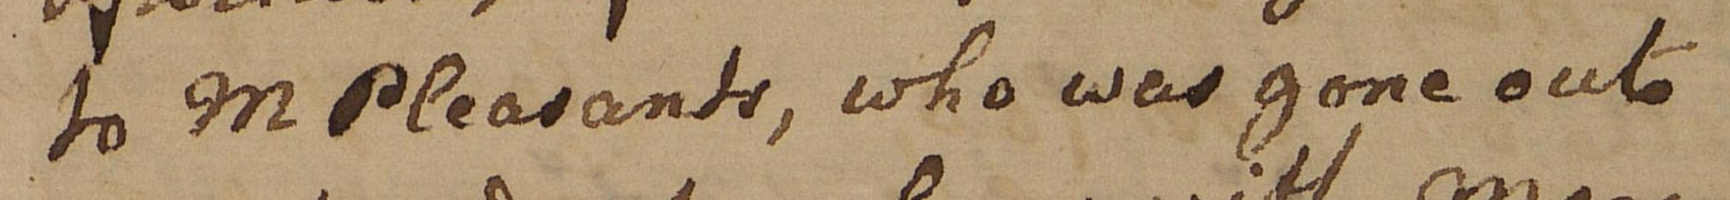to M Pleasants, who was gone out
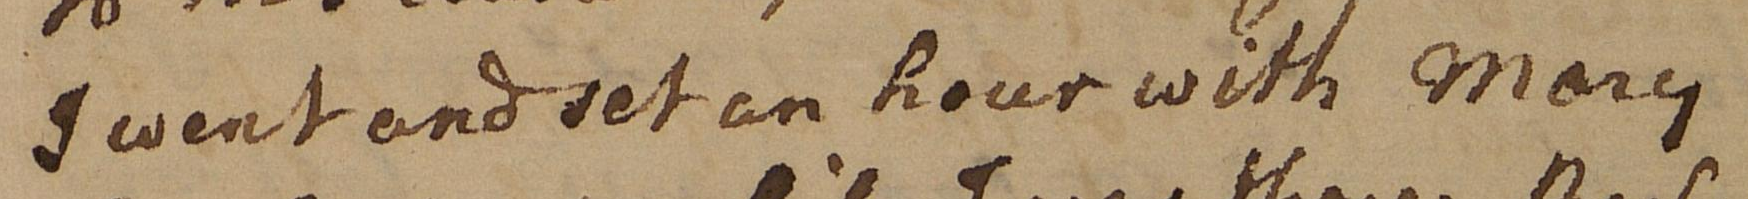I went and set an hour with Mary
